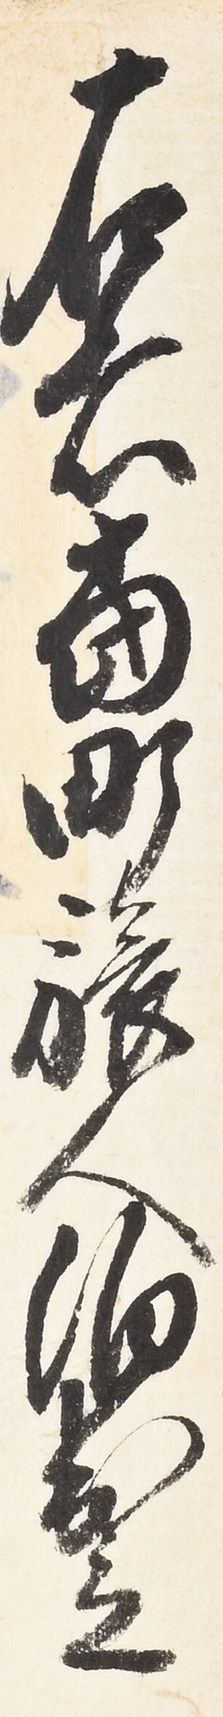右者当町旅人泊出立
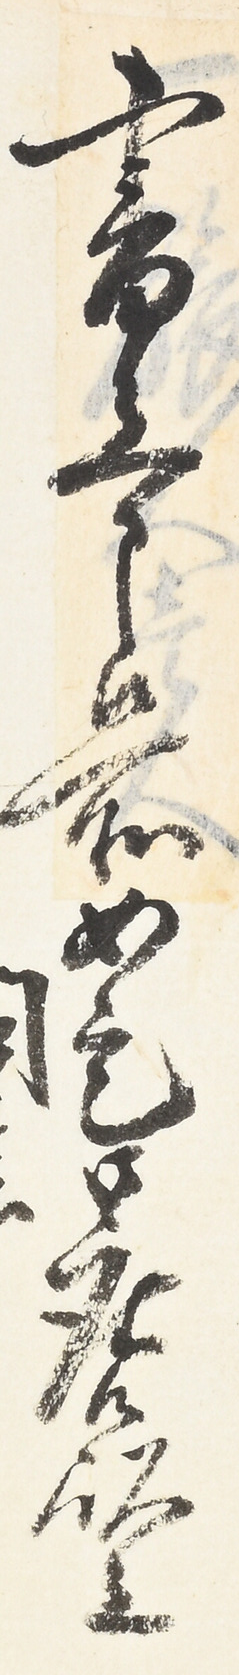書上申候所如是御座候以上
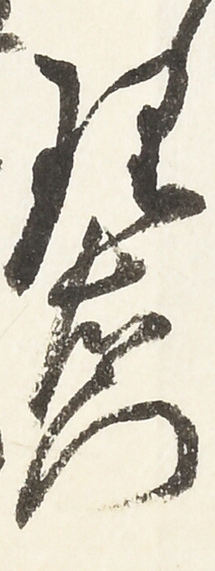平右衛門
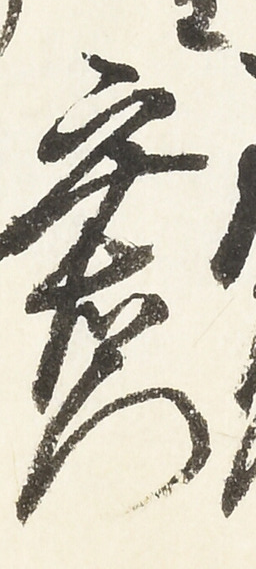平右衛門
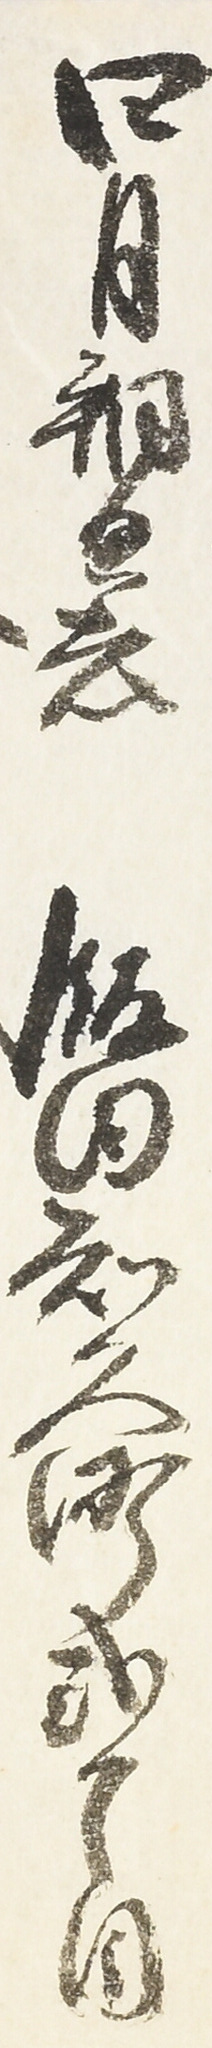四月朔日着飯田知久町弐丁目
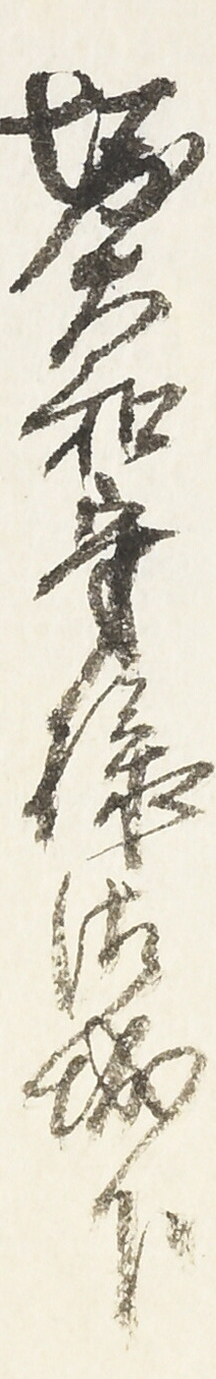堀大和守様御城下
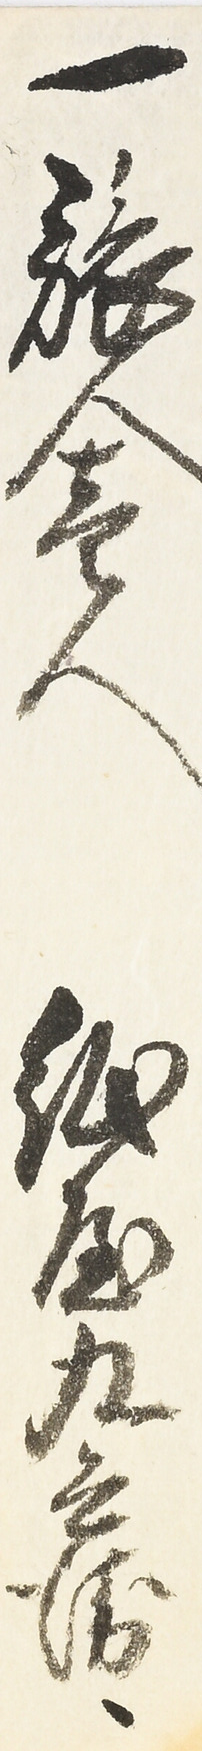一旅人壱人紙屋九兵衛・
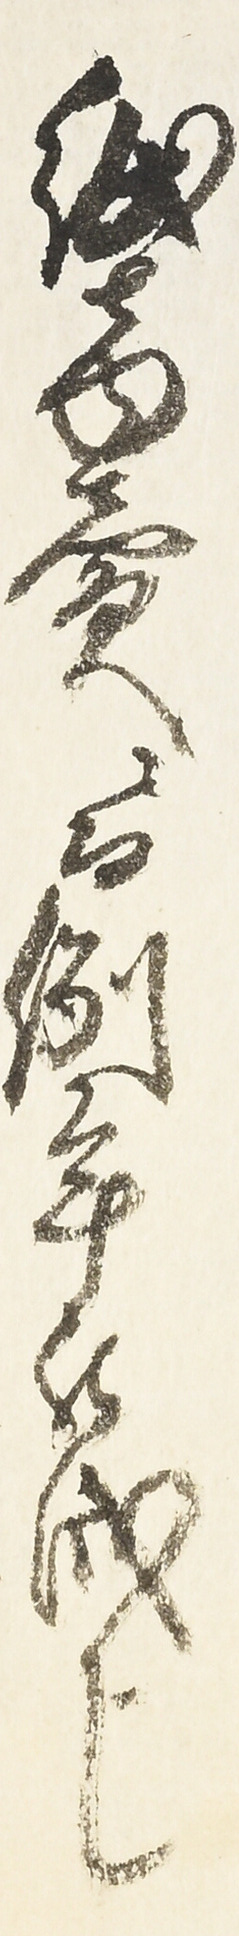紙商売ニ而例年罷越申候
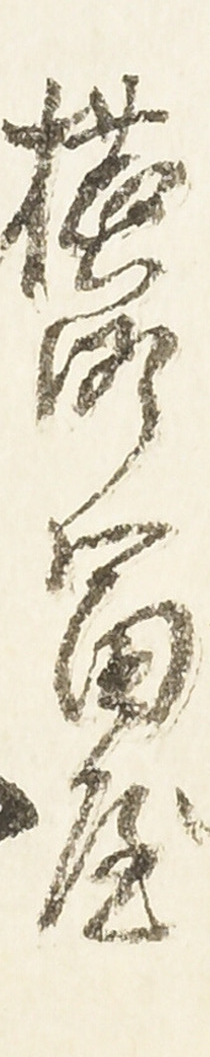横町冨屋
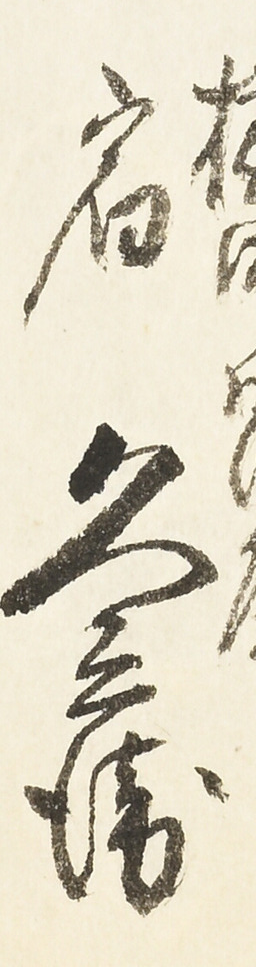宿久兵衛
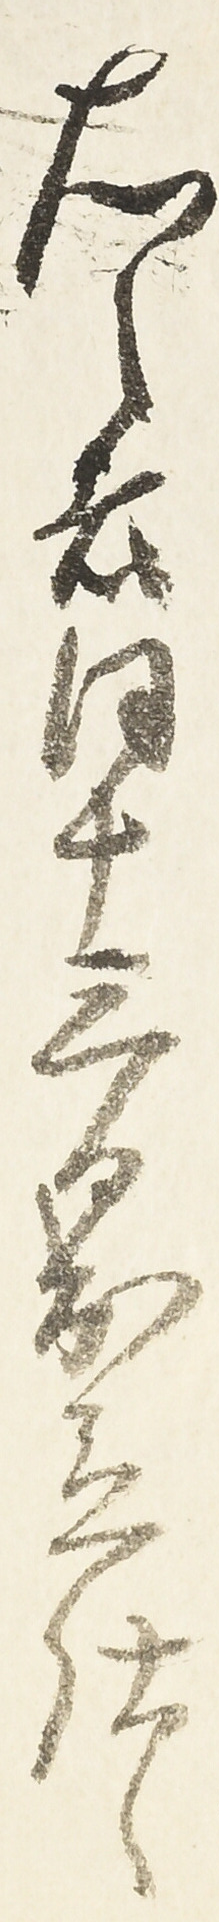右之者同十三日出立仕候
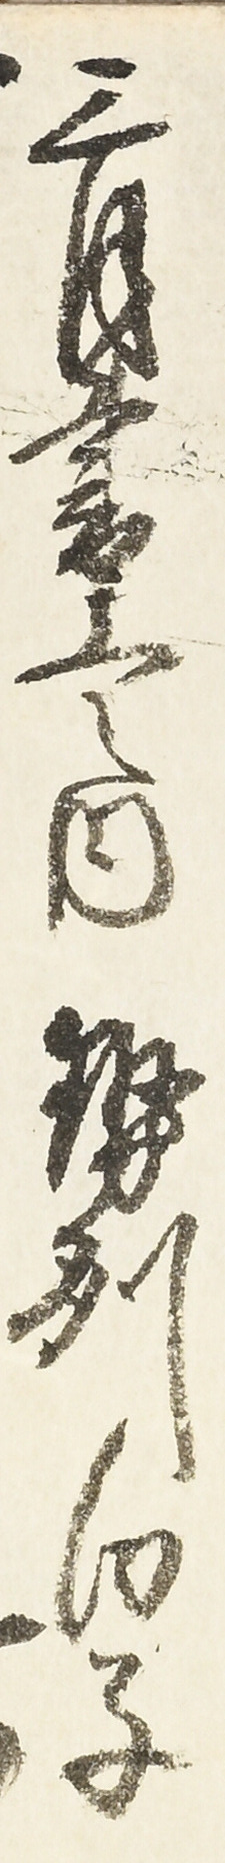三月書上之内勢州白子
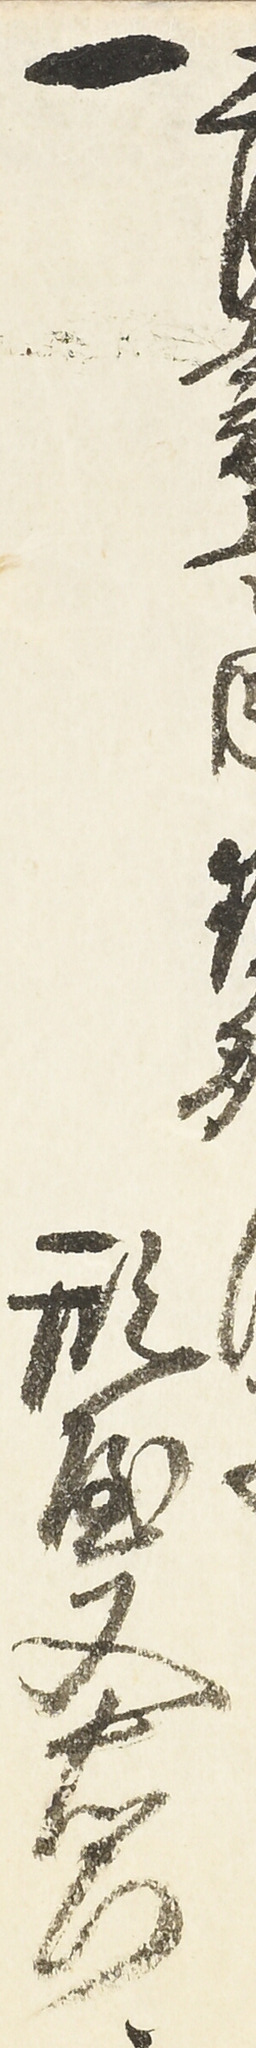一形屋又右衛門・
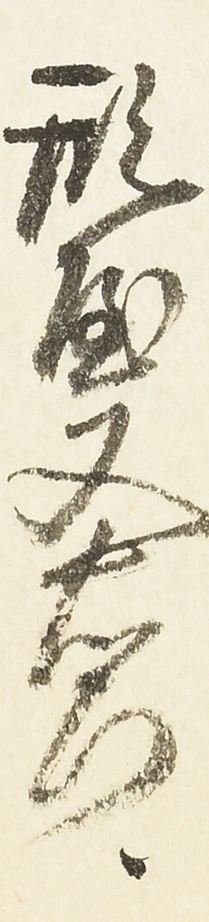一形屋又右衛門・
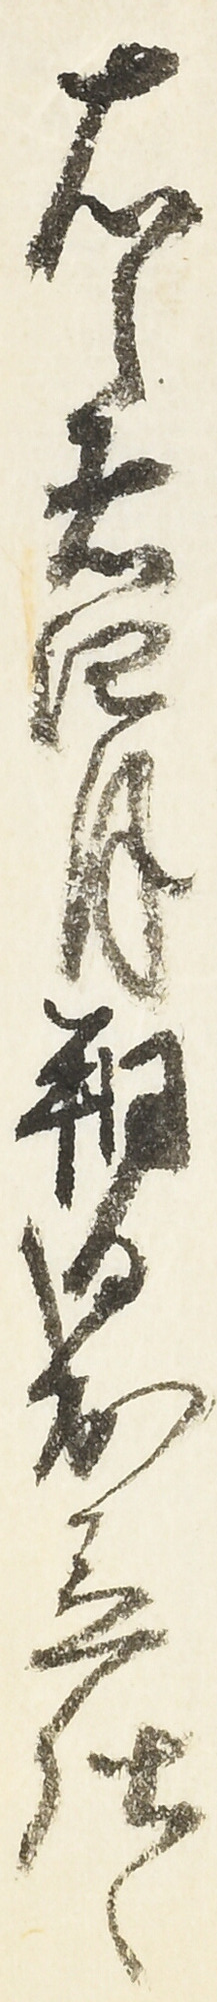右之者四月朔日出立仕候
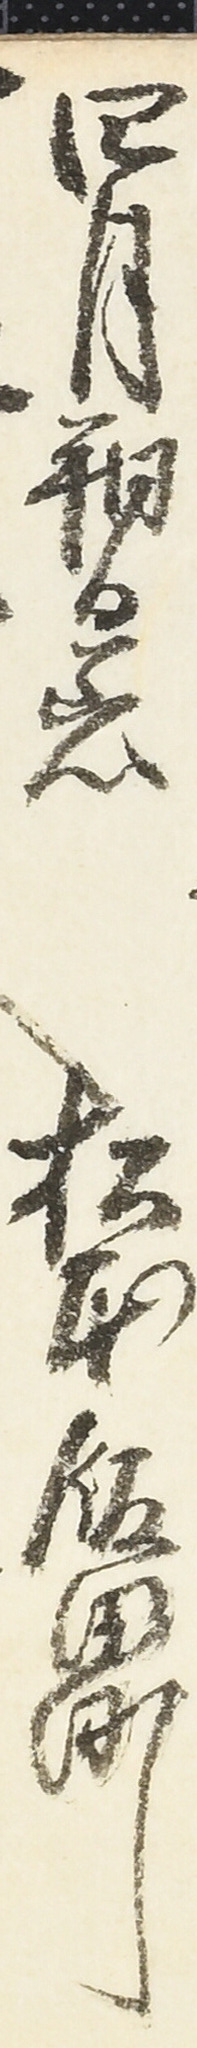四月朔日着松本飯田町
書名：町中旅人泊控帳
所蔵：伊那市立高遠町図書館・合同会社AMANE
